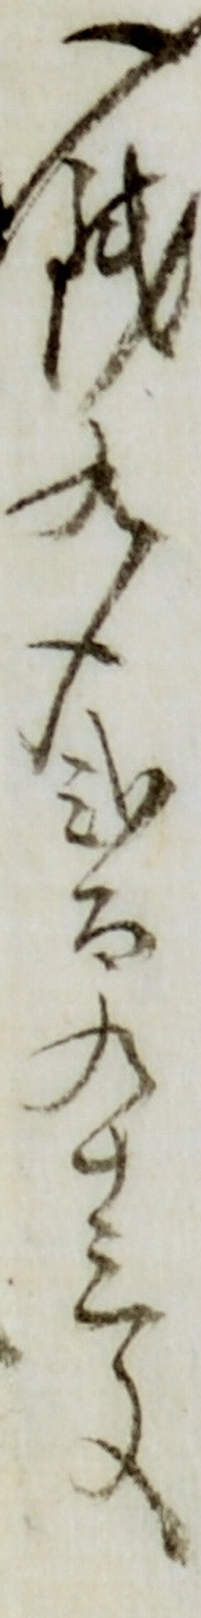銭九貫弐百九十三文
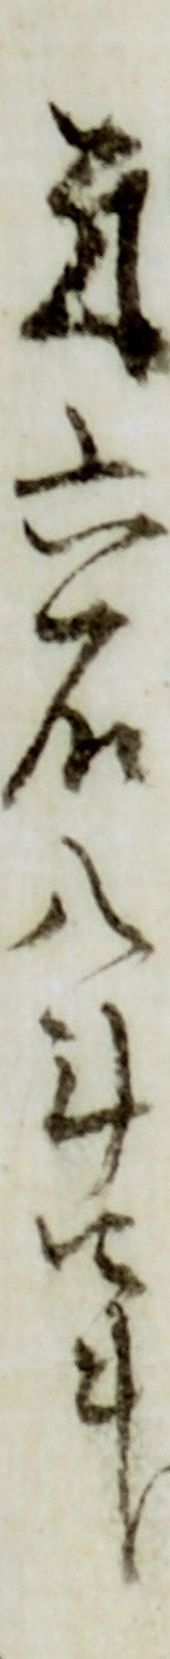米六石八斗四升

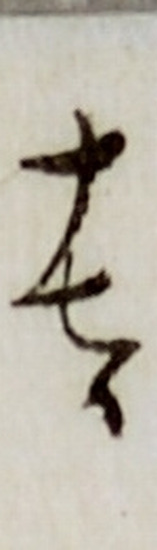十七日
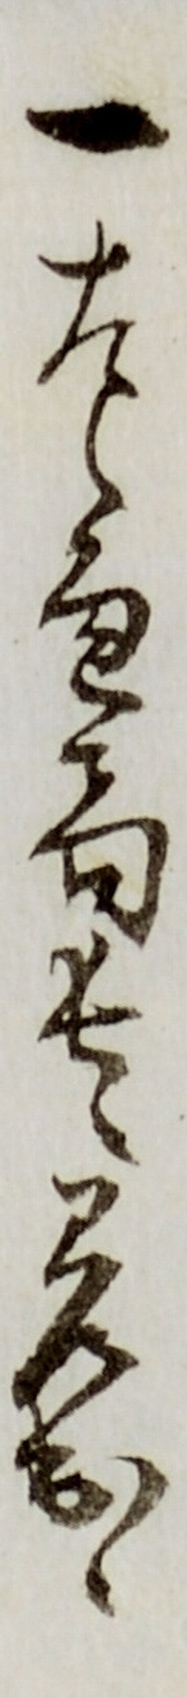一左之通局長へ差出候
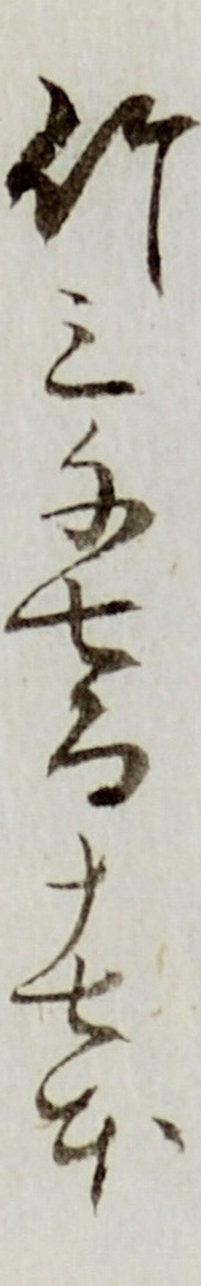竹三千七百十七本
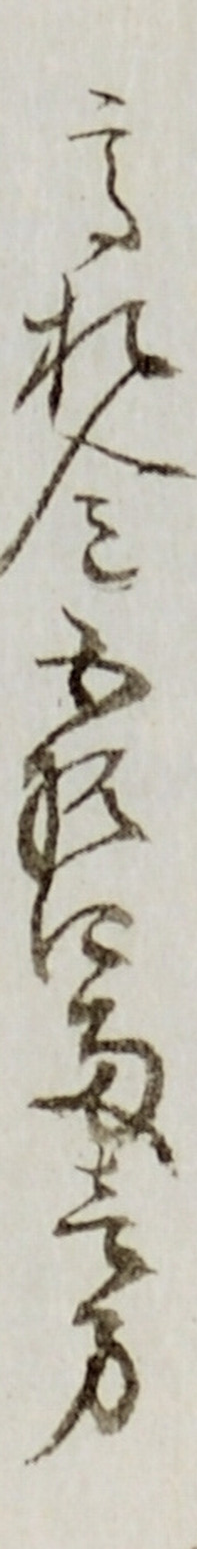高札金五拾四両壱分
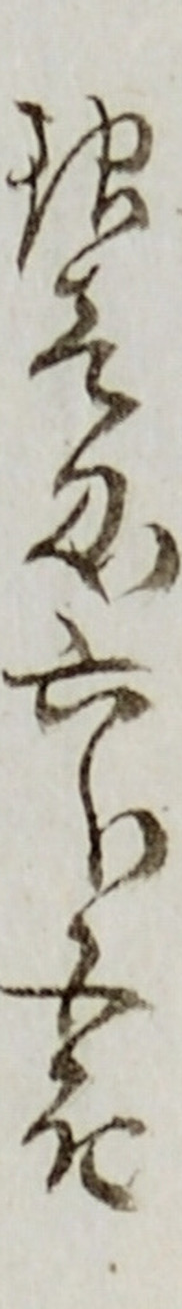銀壱匁六分五厘
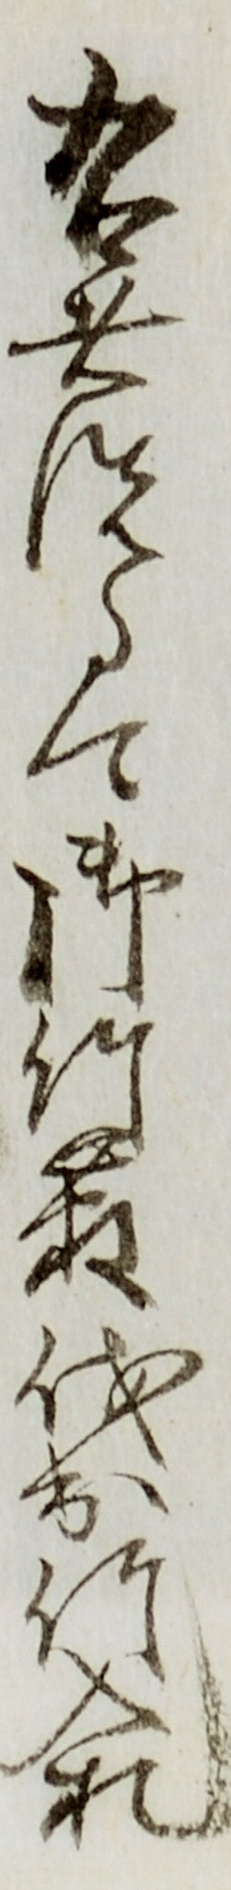右は洗馬郷御竹藪伐出竹入札
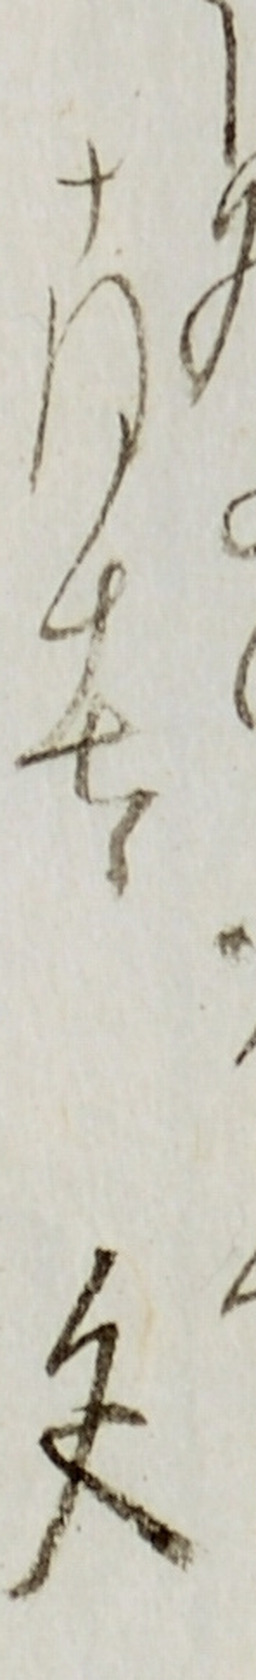十月十七日名
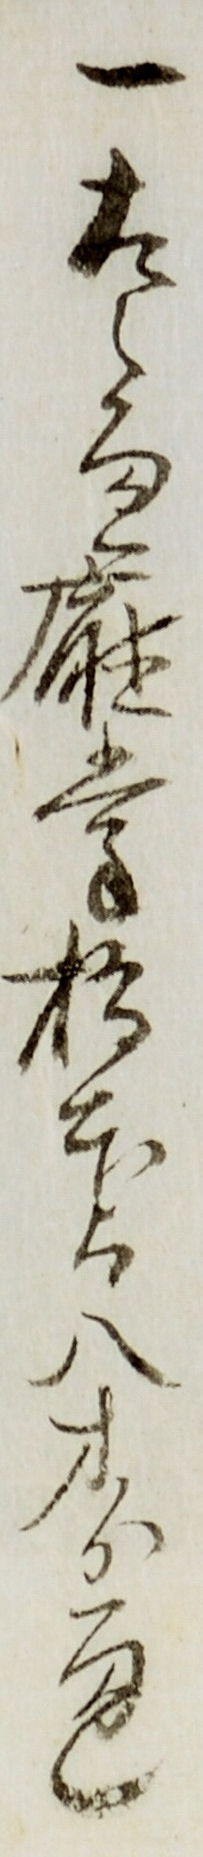一左之通庁掌橋本与八方ゟ通
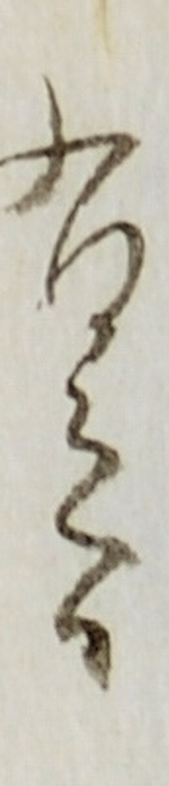有之候
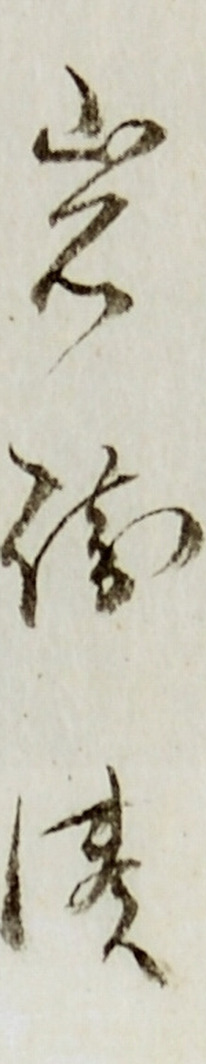岩崎湊
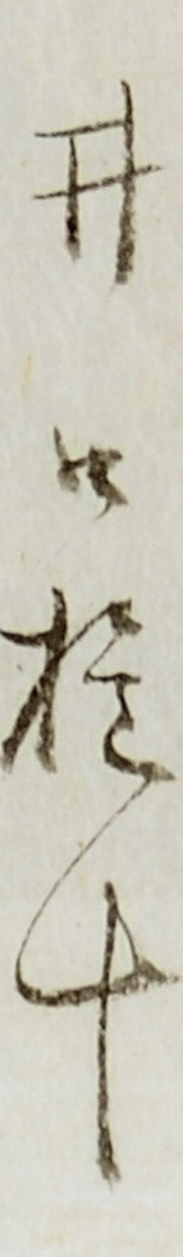井口権十
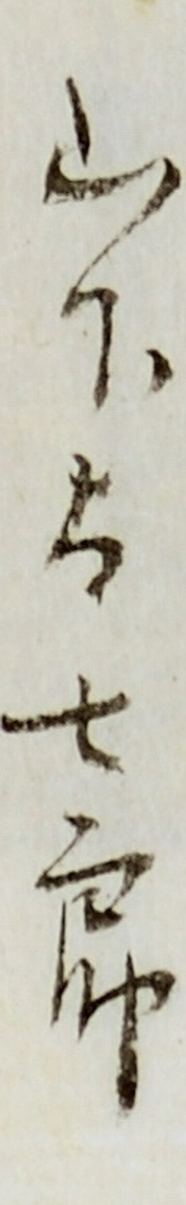山下与七郎
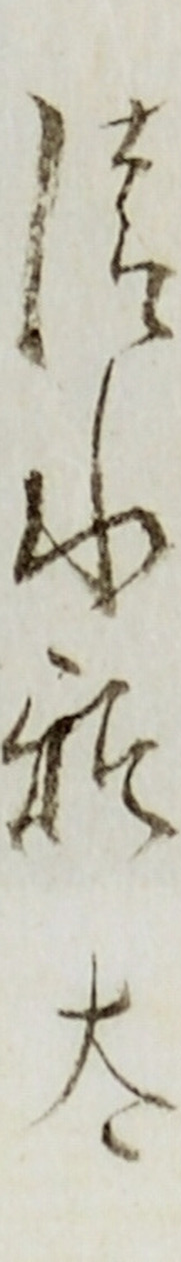清水新太
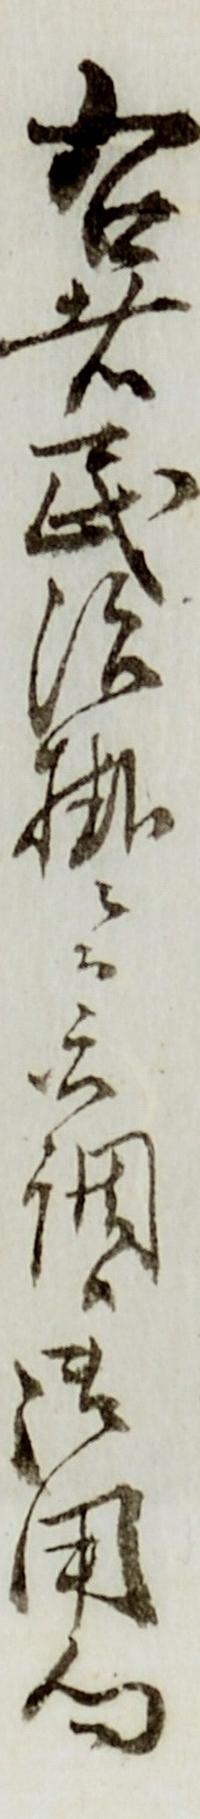右は民治掛にて取調候御用向
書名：山林方諸事御用留
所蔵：伊那市立高遠町図書館・合同会社AMANE
